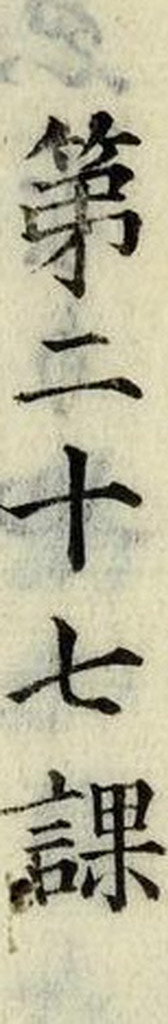第二十七課
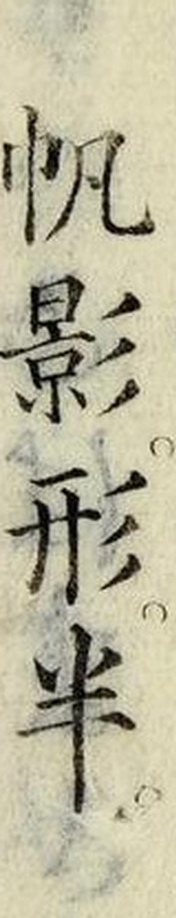帆影。形。半。
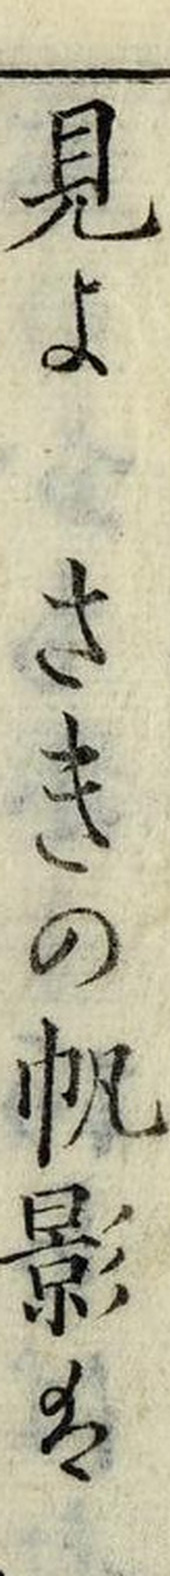見よさきの帆影は
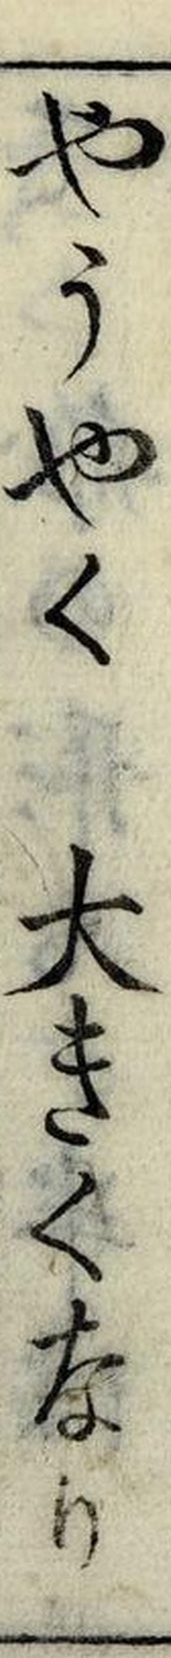やうやく大きくなり

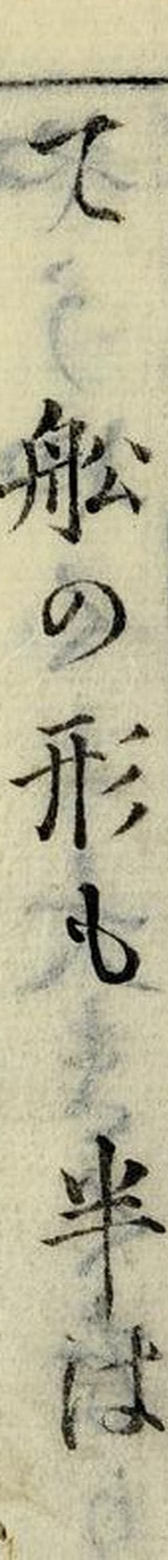て船の形も半は
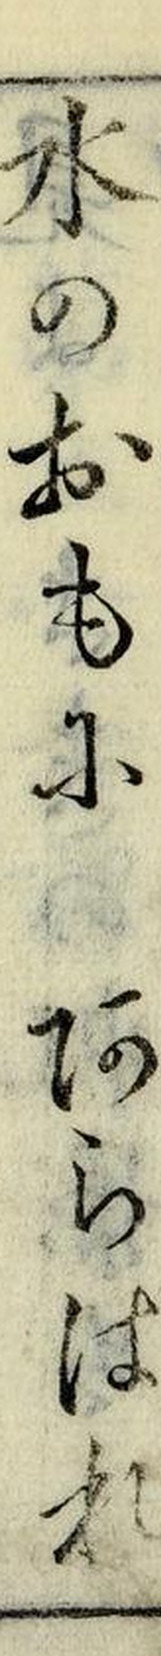水のおもにあらはれ
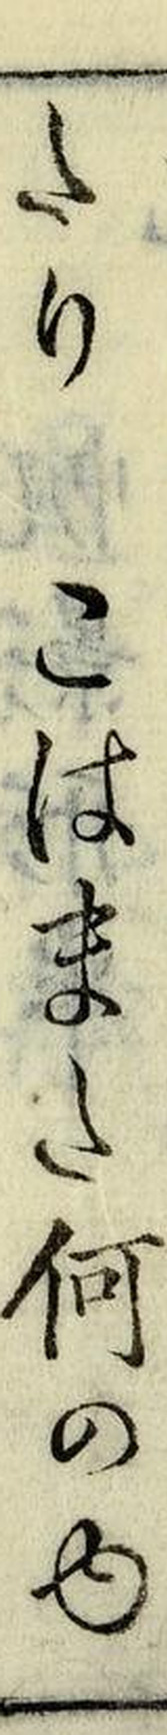たりこはまた何のゆ
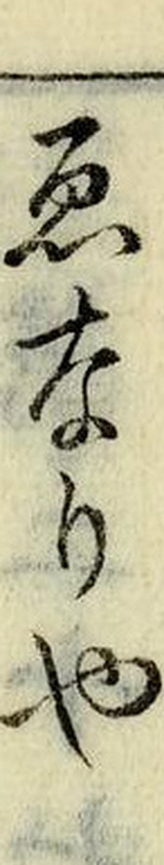ゑなりや
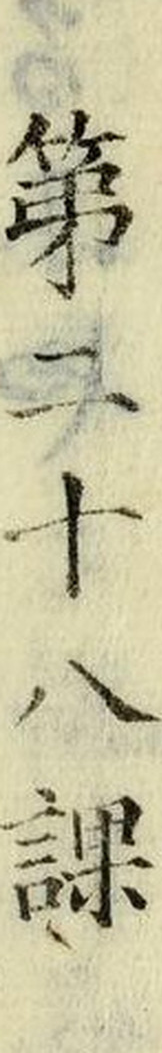第二十八課
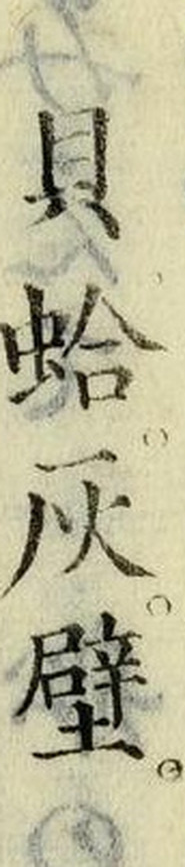貝。蛤。灰。壁
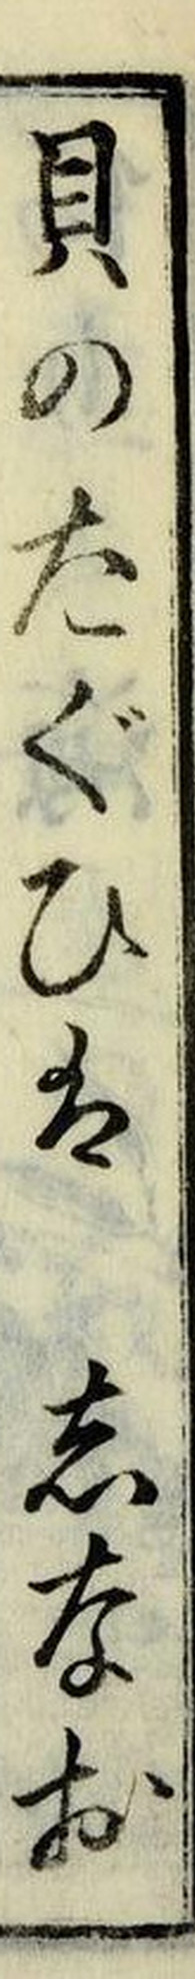貝のたぐひはしなお
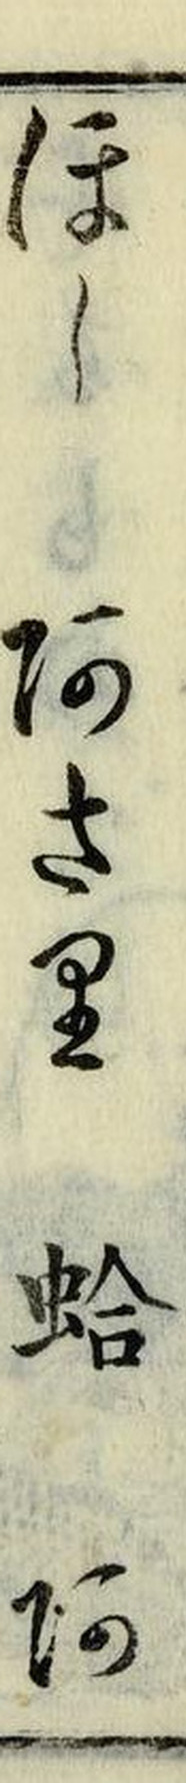ほしあさり蛤あ
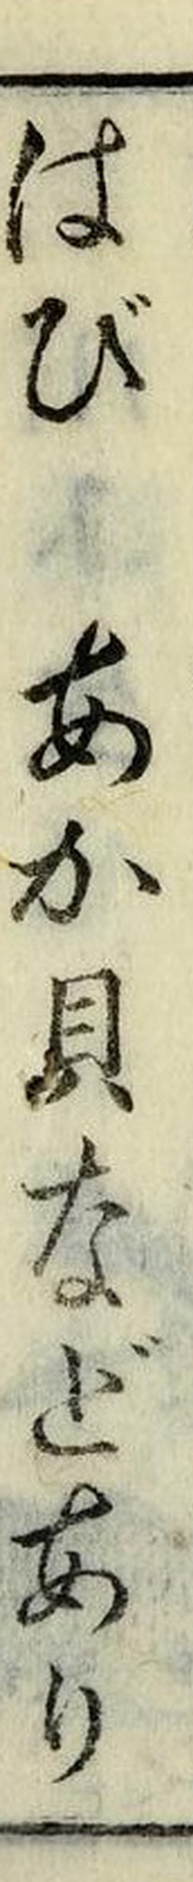はびあか貝などあり
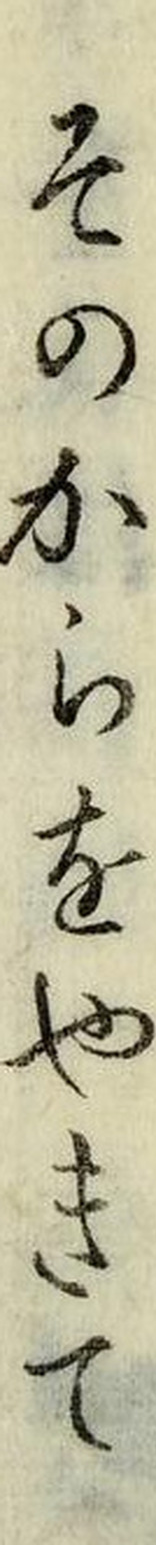そのからをやきて
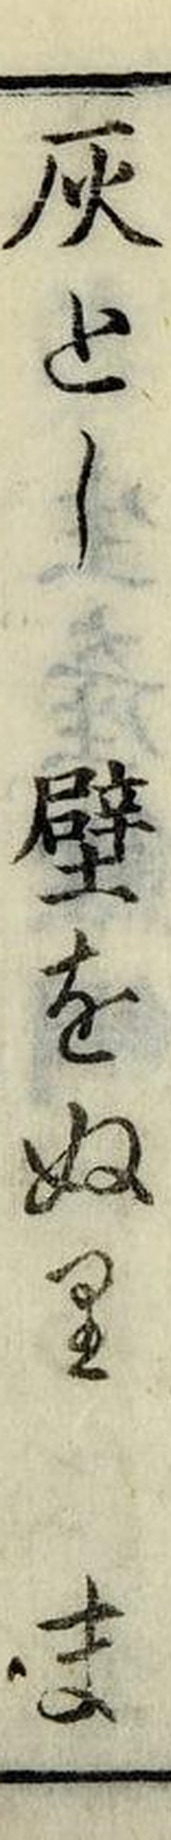灰とし壁をぬりま
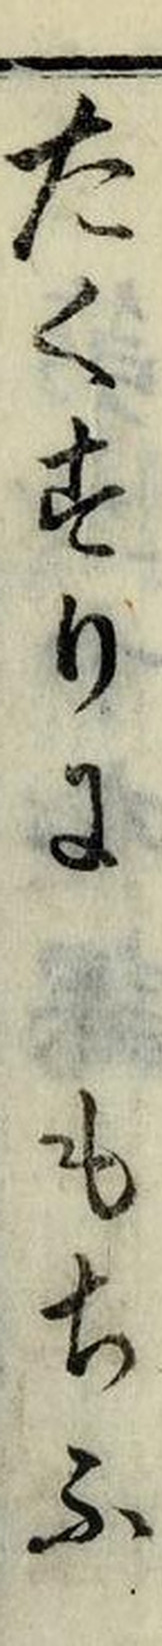たくすりにもちふ
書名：小学読本 初等科 巻一
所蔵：福井県文書館 Fukui Prefectural Archives
